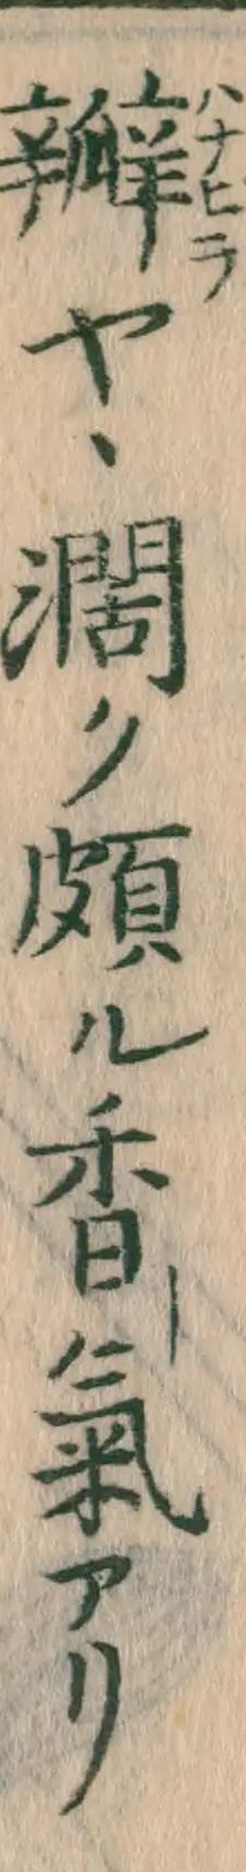弁ヤヽ闊ク頗ル香-気アリ
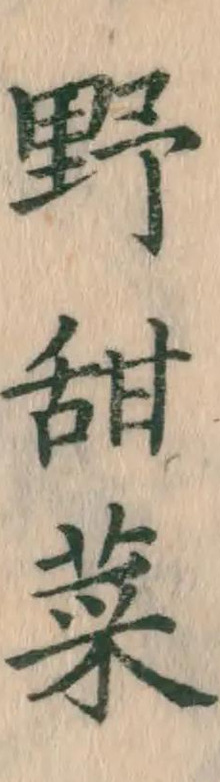野甜菜

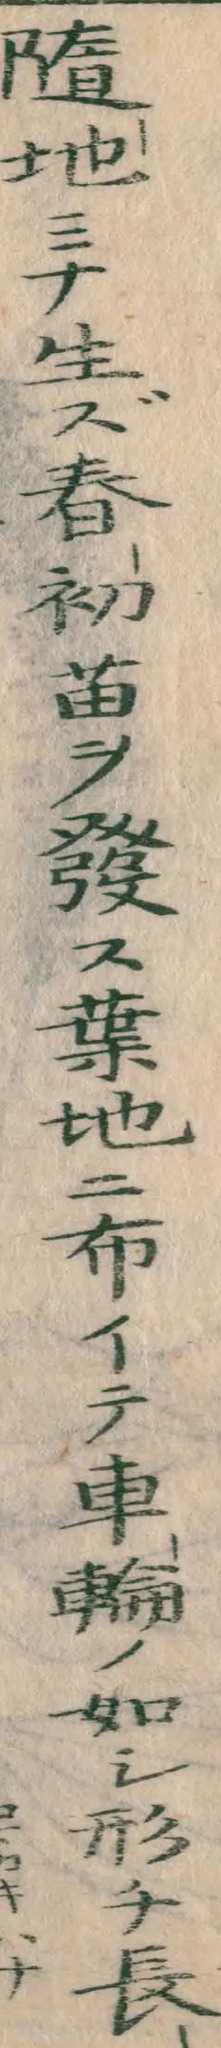随-地ミナ生ズ春-初苗ヲ発ス葉地ニ布イテ車-輪ノ如シ形チ長-
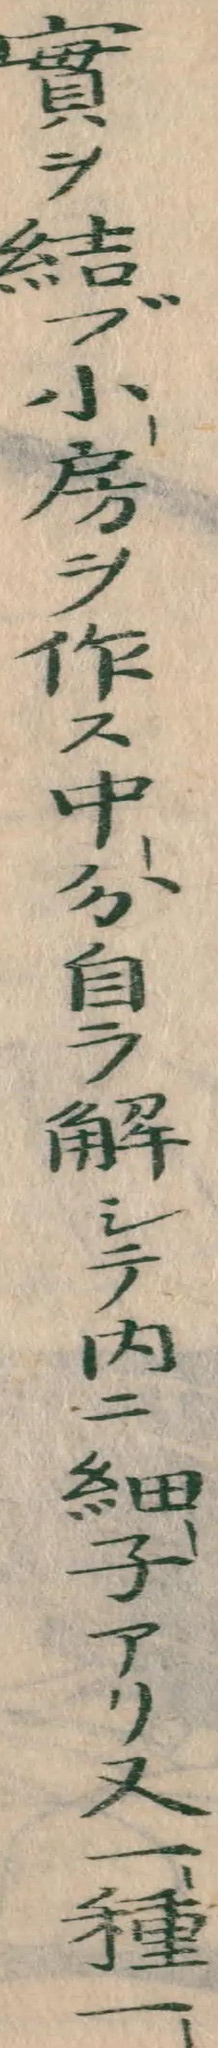実ヲ結ブ小-房ヲ作ス中-分自ラ解シテ内ニ細-子アリ又一-種一-
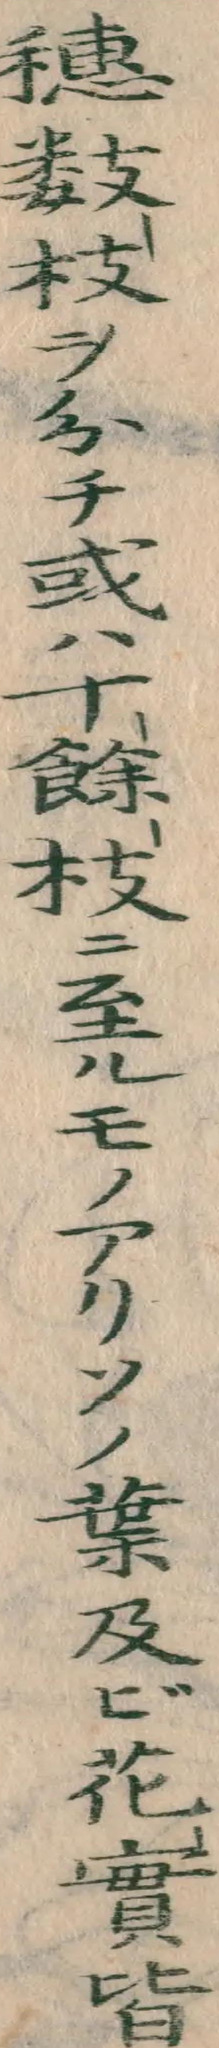穂数-枝ヲ分チ或ハ十-余-枝ニ至ルモノアリソノ葉及ビ花-実皆
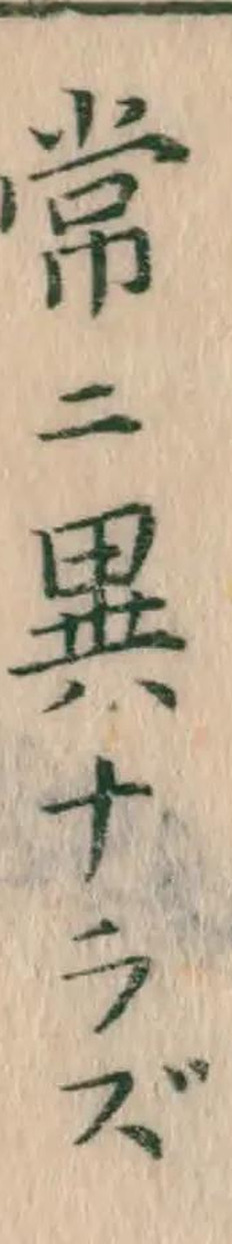常ニ異ナラズ
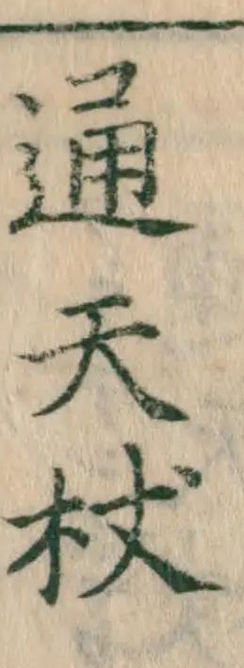通天杖

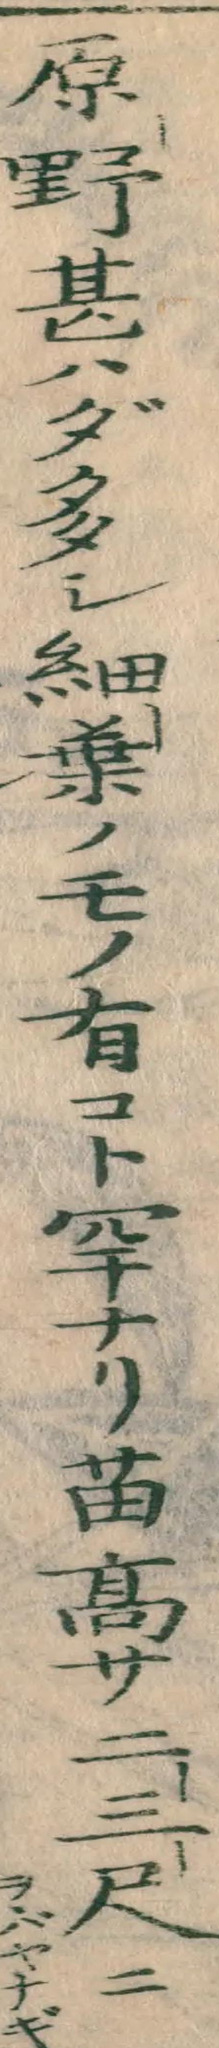原-野甚ハダ多シ細-葉ノモノ有コト罕ナリ苗高サ二-三-尺ニ
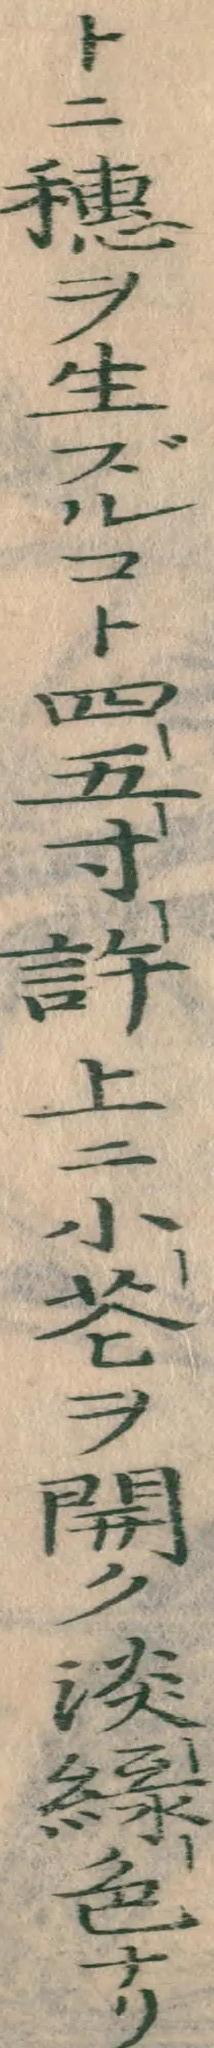トニ穂ヲ生ズルコト四-五-寸-許上ニ小-花ヲ開ク淡-緑-色ナリ
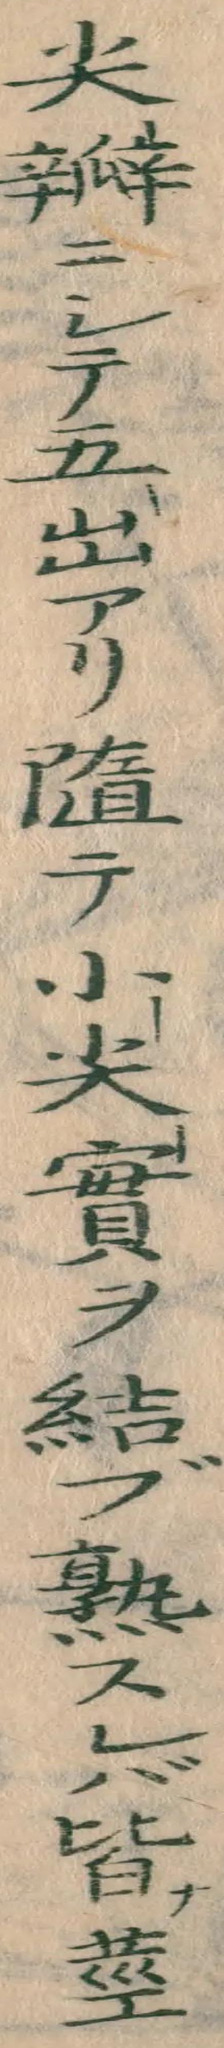尖-弁ニシテ五-出アリ随テ小-尖-実ヲ結ブ熟スレバ皆茎
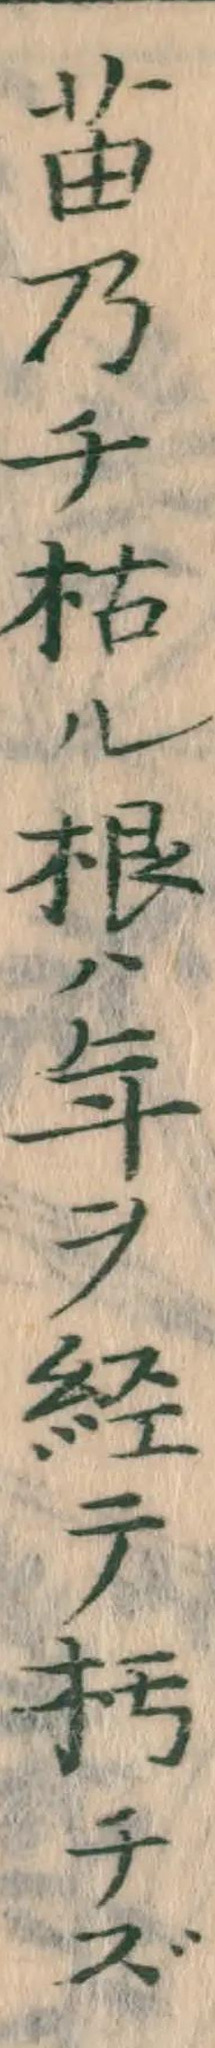苗乃チ枯ル根ハ年ヲ経テ朽チズ

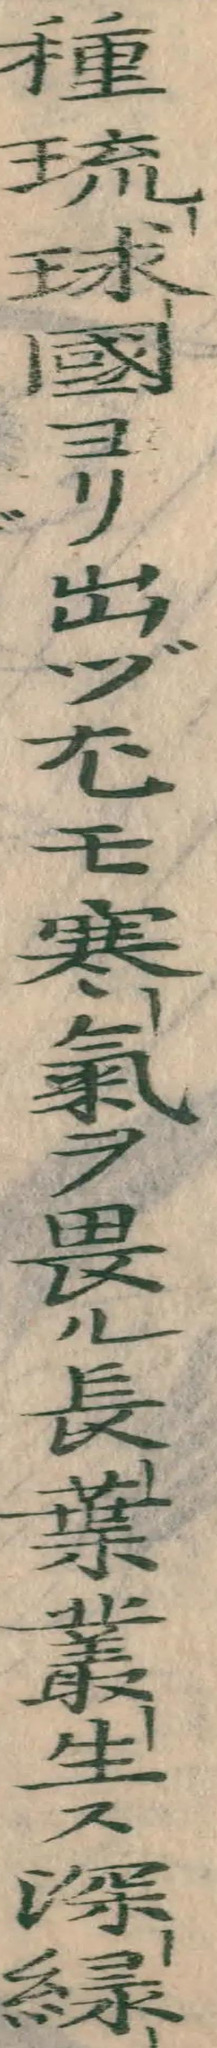種琉-球-国ヨリ出ヅ尤モ寒-気ヲ畏ル長-葉叢-生ス深-緑-
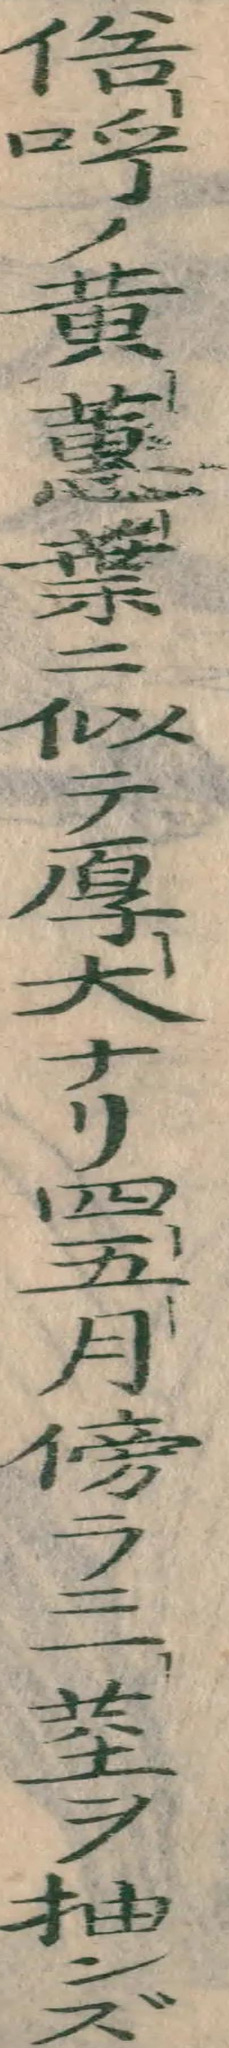俗-呼ノ黄-蕙-葉ニ似テ厚-大ナリ四-五-月傍ラニ一-茎ヲ抽ンズ
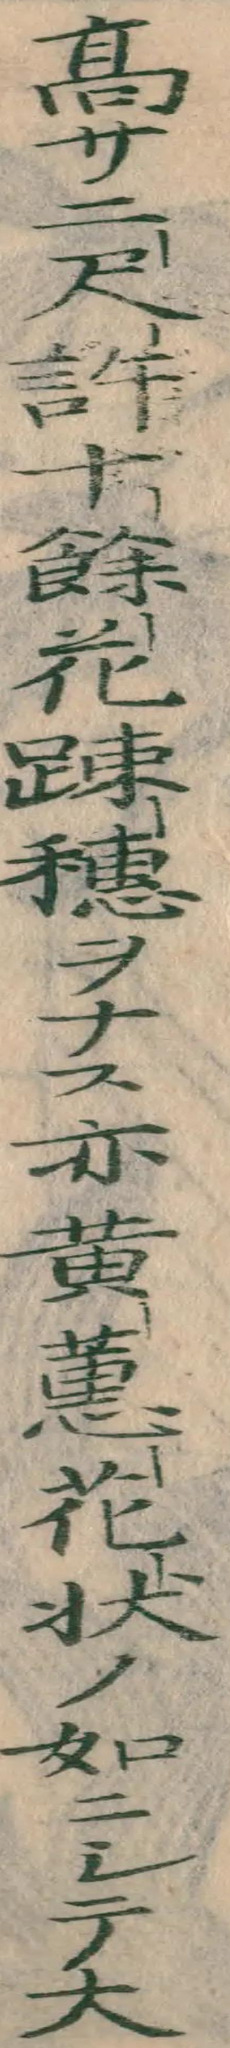高サ二-尺-許十-余-花疏-穂ヲナス亦黄-蕙-花-状ノ如ニシテ大
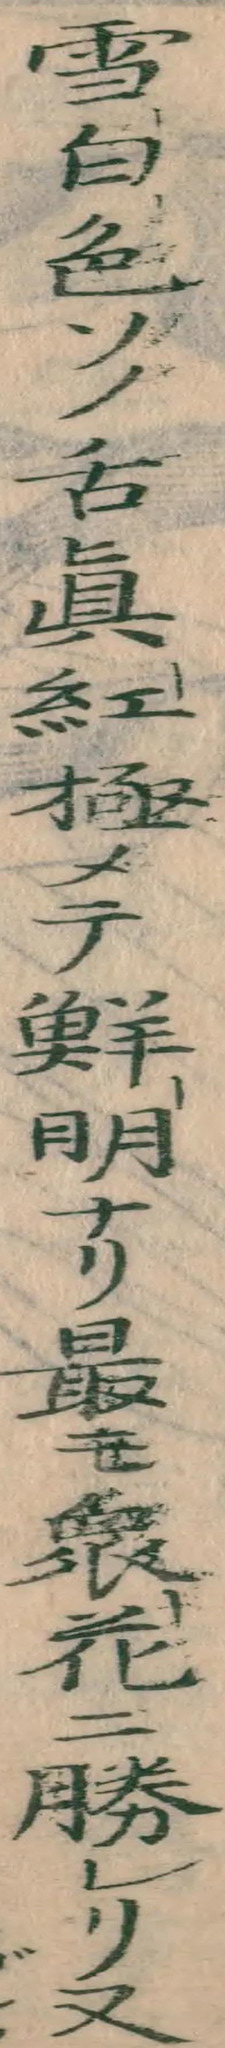雪-白-色ソノ舌真-紅極メテ鮮-明ナリ最モ衆-花ニ勝レリ又
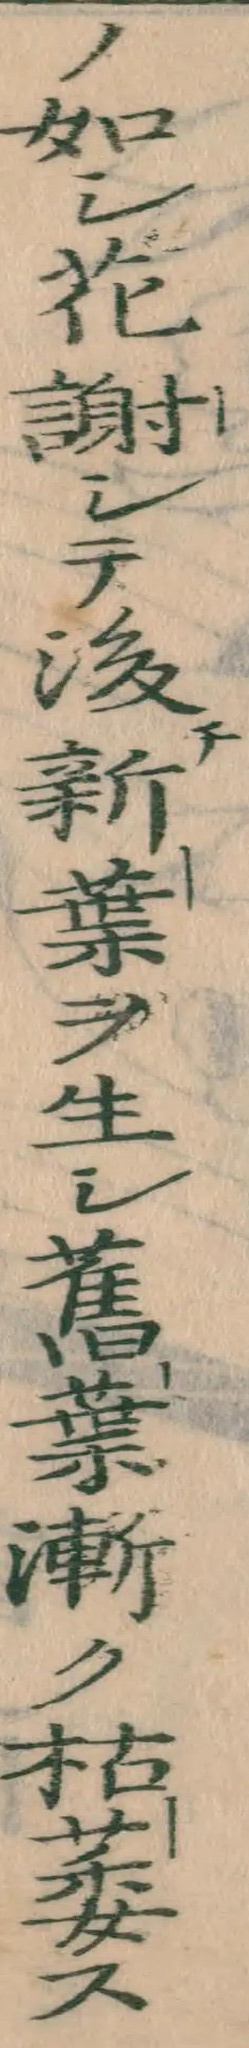ノ如シ花謝シテ後新-葉ヲ生シ旧-葉漸ク枯-萎ス
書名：花彙 草部4巻木部4巻. [1]
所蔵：国立国会図書館 National Diet Library, JAPAN
